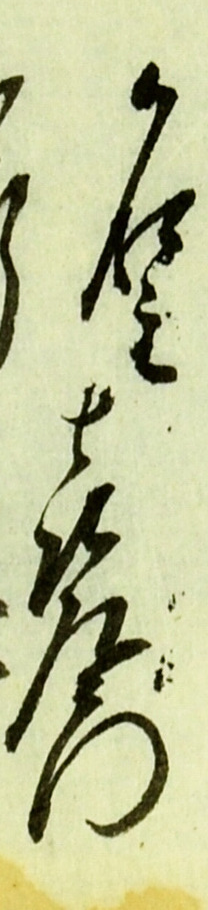名主喜左衛門
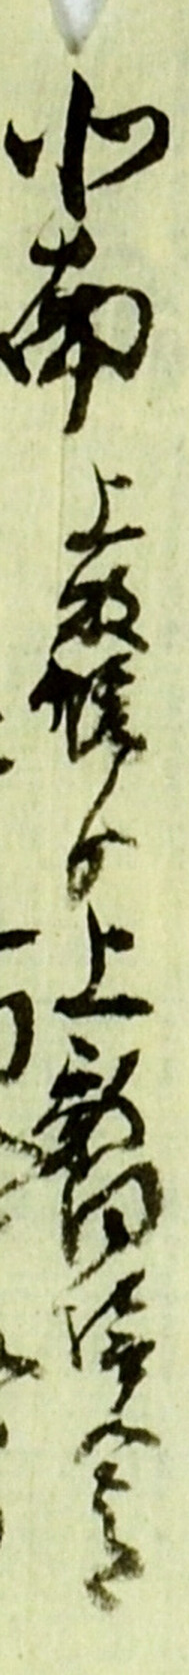北南上牧境ゟ上新田境迄
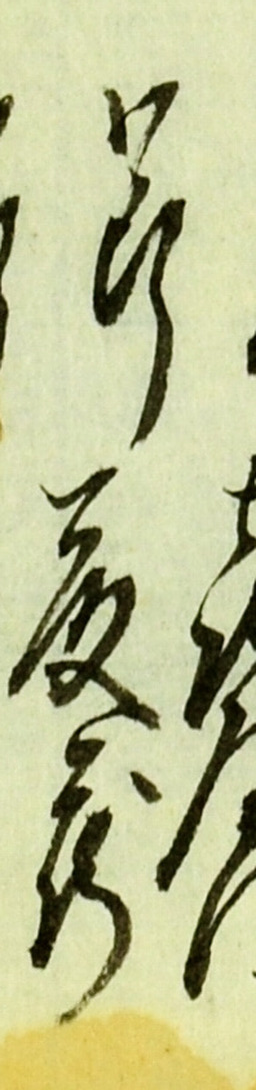同断藤蔵
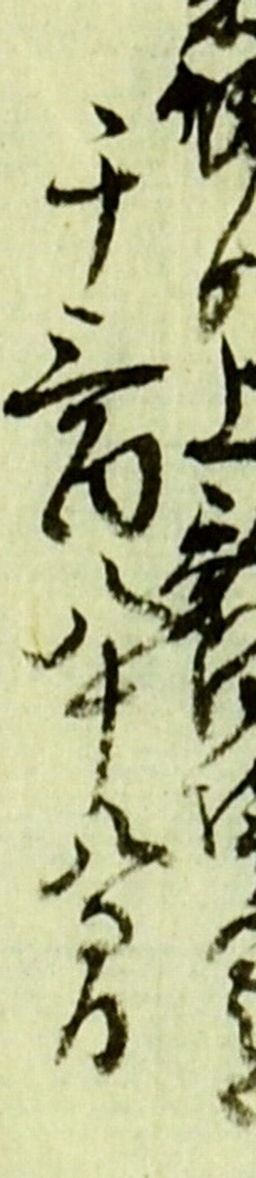千三百八十八間
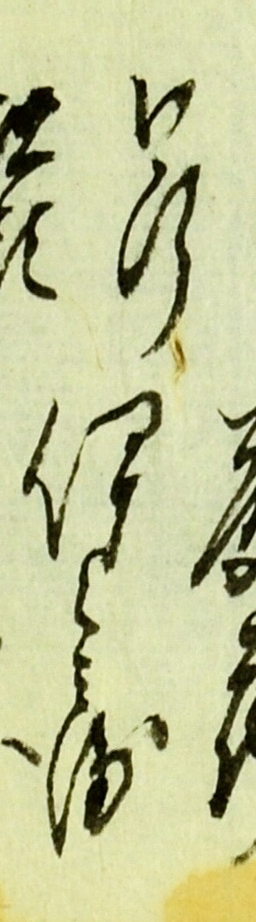同断伊兵衛
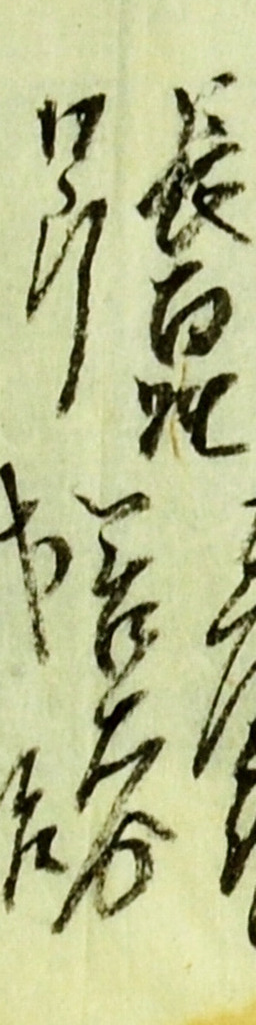同断義右衛門
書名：覚
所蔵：伊那市立高遠町図書館・合同会社AMANE
